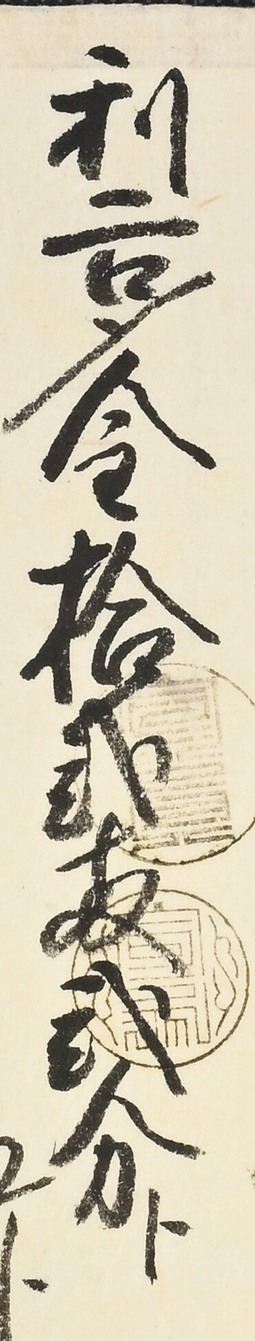此二口〆金拾弐両弐分ト
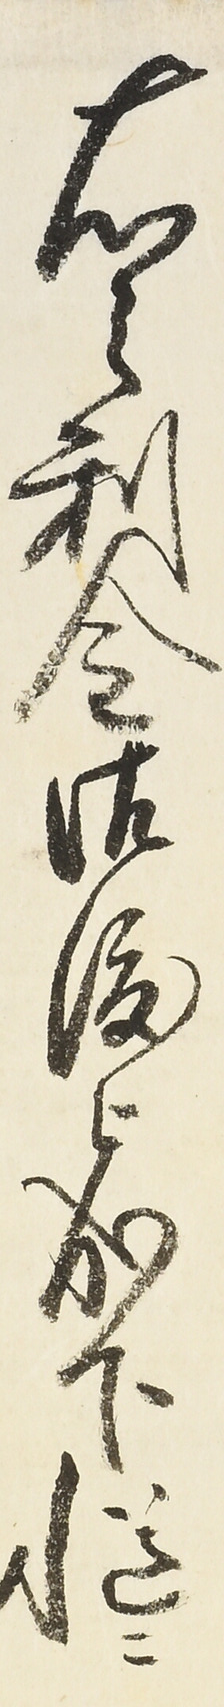右之利金御渡被成下慥ニ
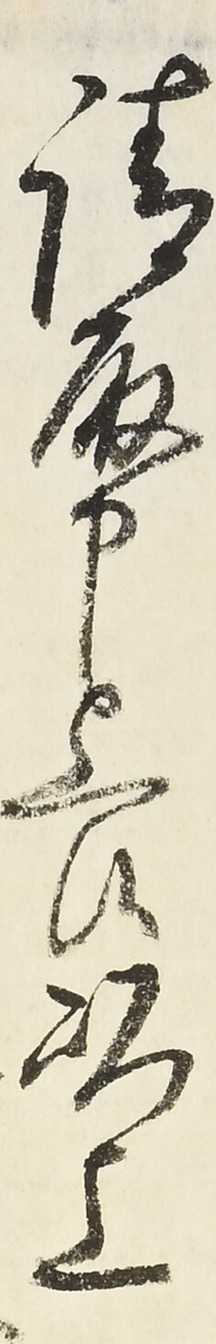請取申上候以上
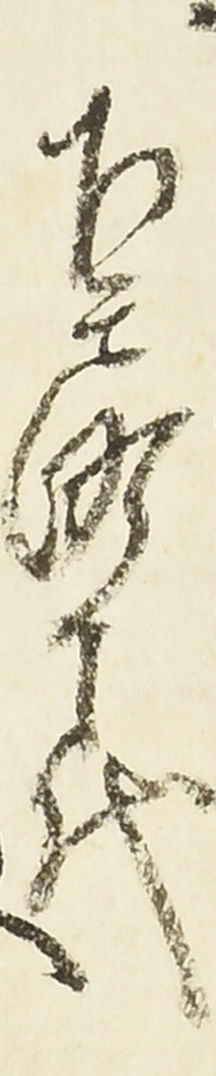下モ町丁代
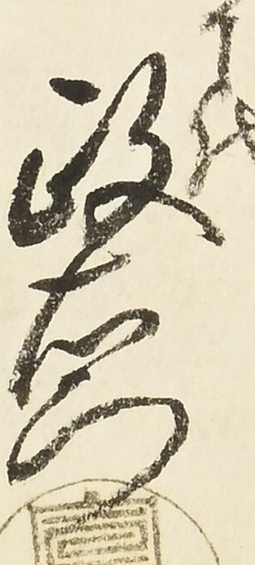政右衛門
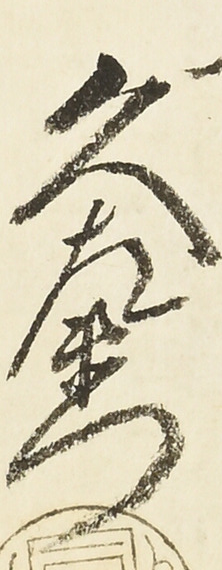久左衛門
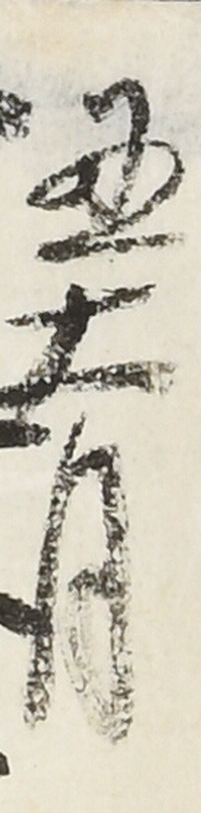丑十一月
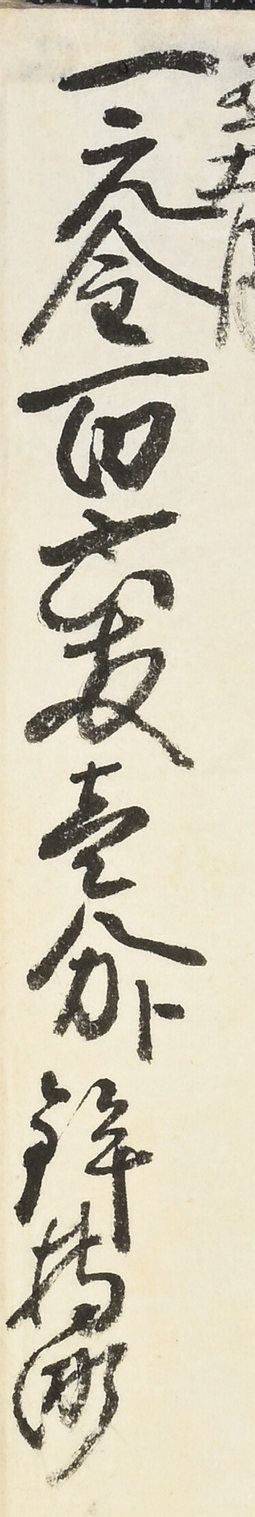一元金百六両壱分ト鉾持町
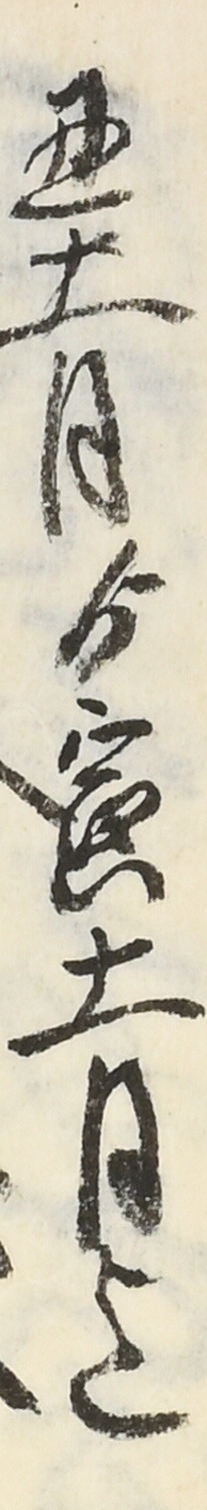丑十一月ゟ寅ノ十一月迄
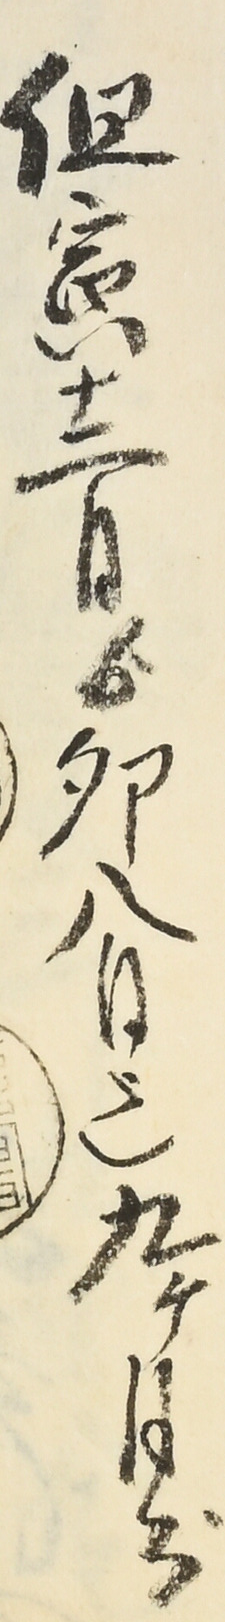但寅十二月ゟ卯八月迄九ヶ月分

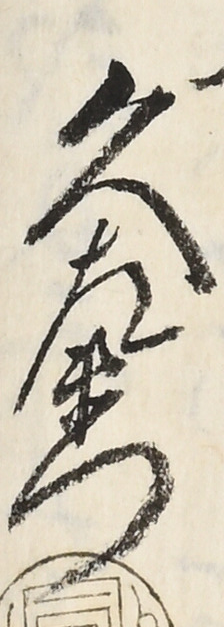治左衛門
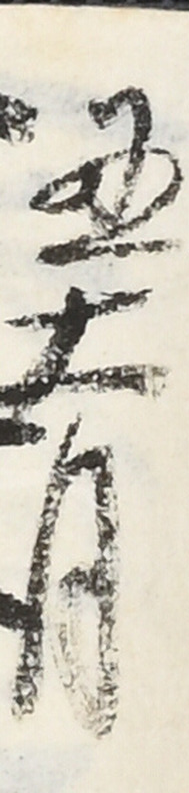丑十一月
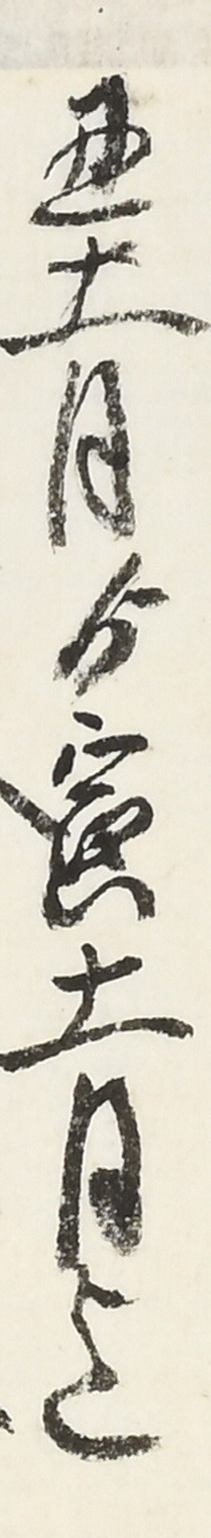丑十一月ゟ寅十一月迄
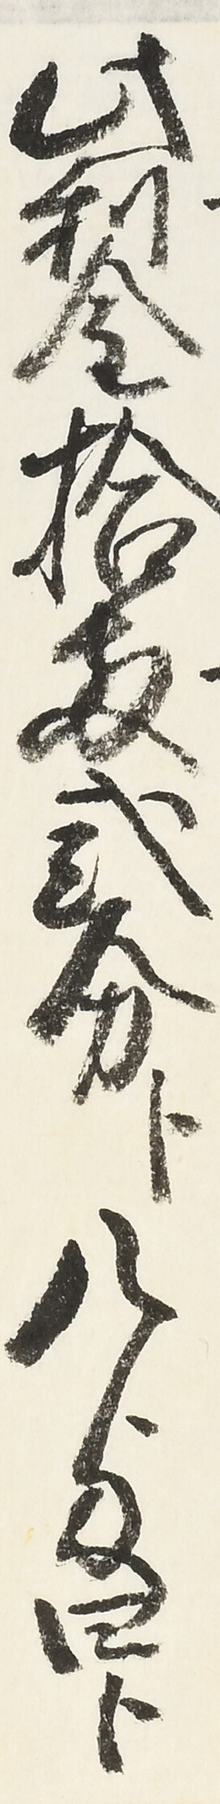此利金拾両弐分ト八匁四分
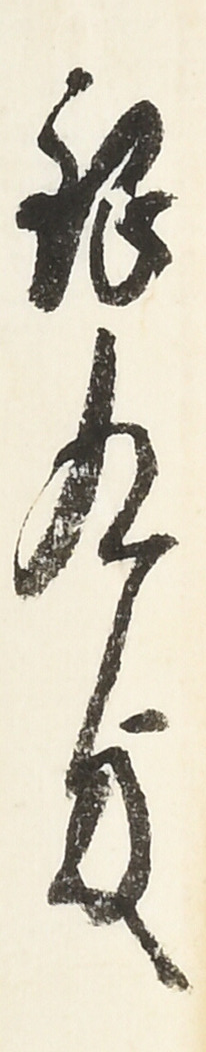銀九匁
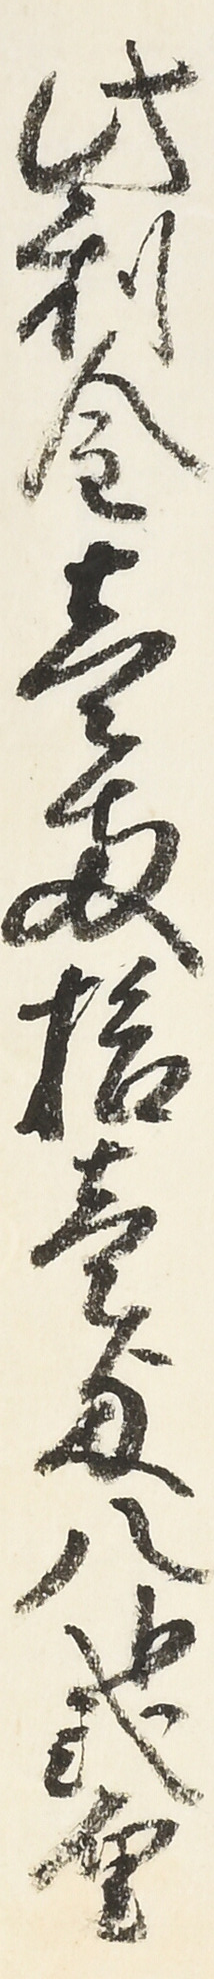此利金壱両拾壱匁八分弐厘
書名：御才覚金御利足割渡扣帳
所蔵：伊那市立高遠町図書館・合同会社AMANE
